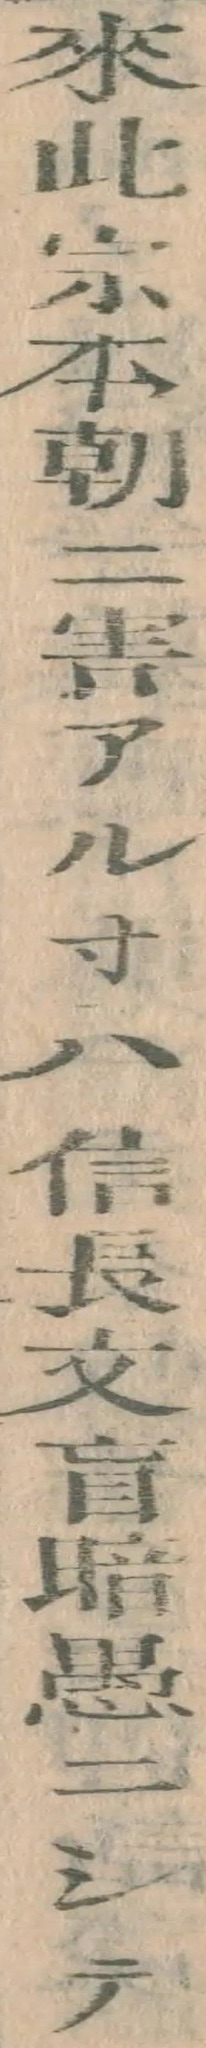来此宗本朝ニ害アル寸ハ信長文盲暗愚ニシテ
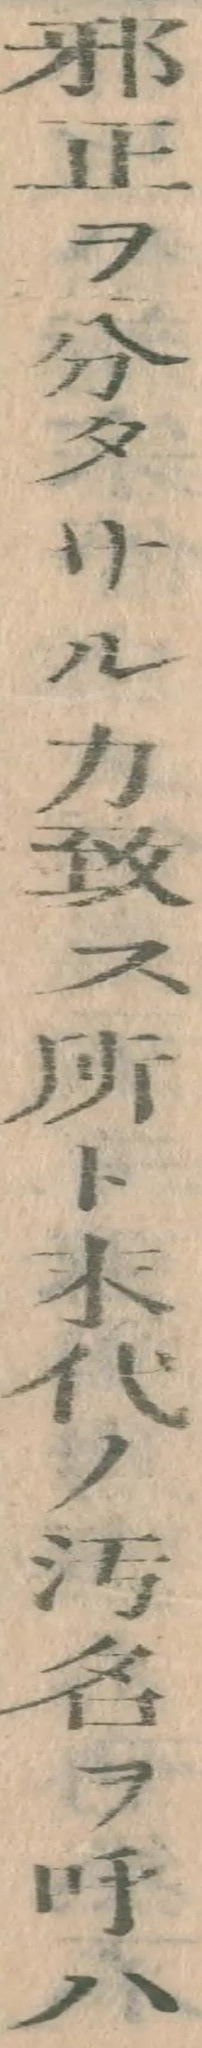邪正ヲ分タサルカ致ス所ト末代ノ汚名ヲ呼ハ
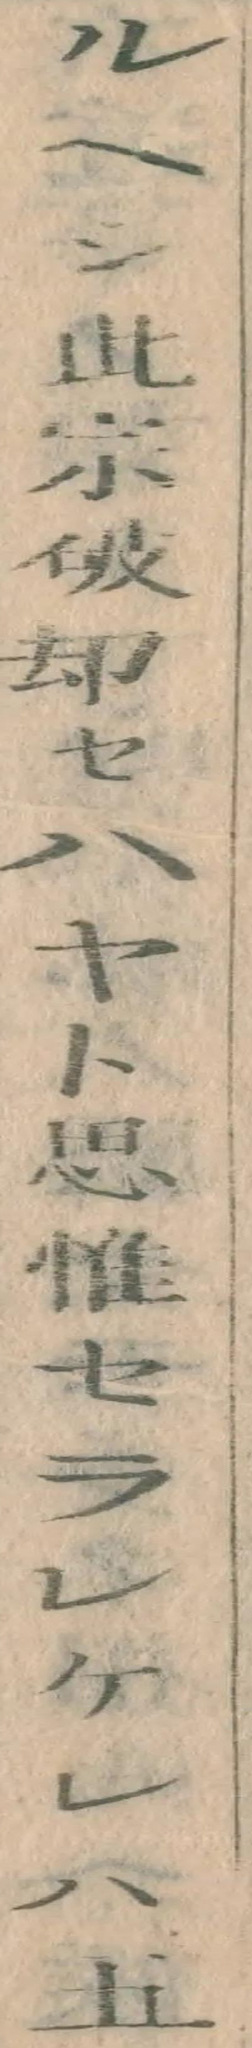ルヘシ此宗破却セハヤト思惟セラレケレハ五
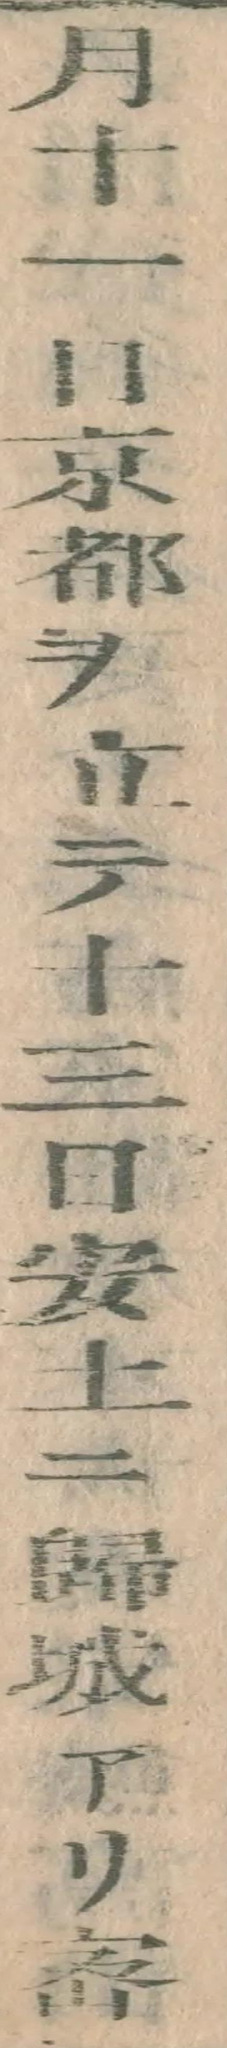月十一日京都ヲ立テ十三日安土ニ帰城アリ密
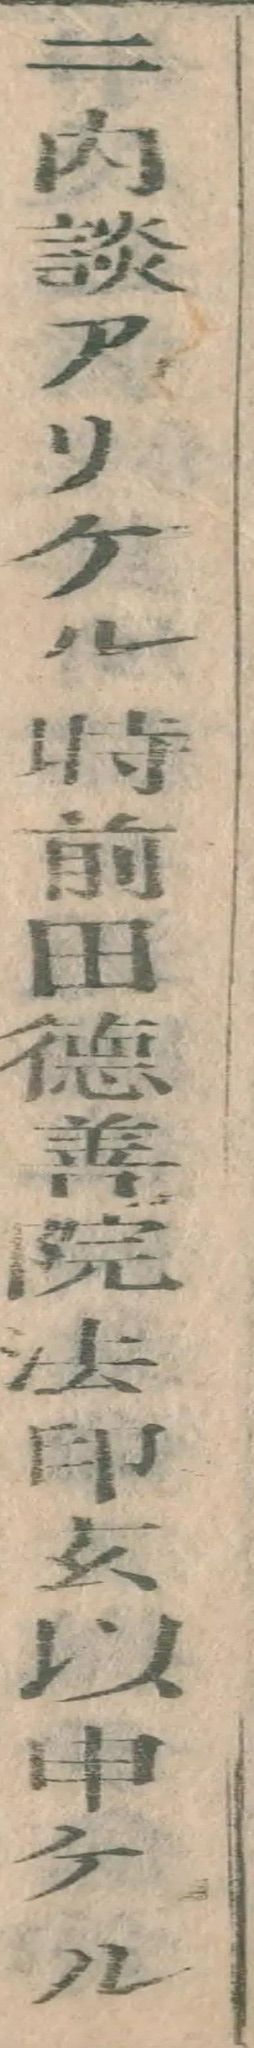ニ内談アリケル時前田徳善院法印玄以申ケル
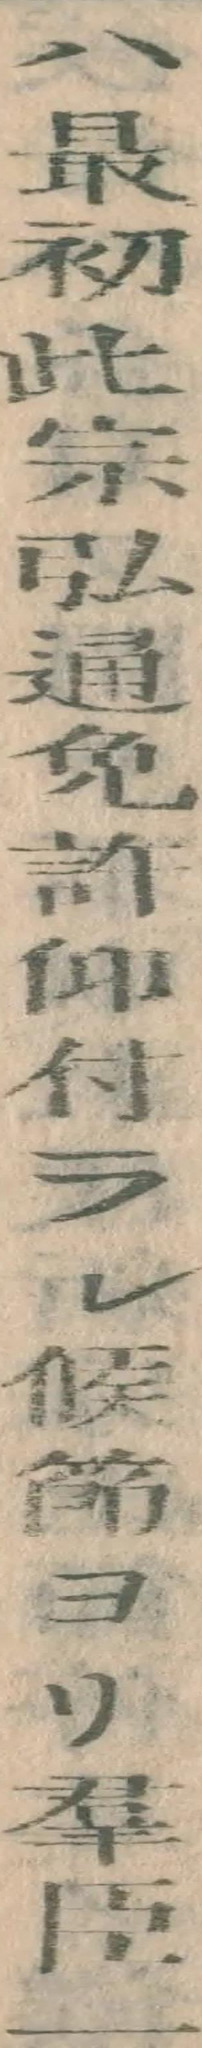ハ最初此宗弘通免許仰付ラレ候節ヨリ群臣一
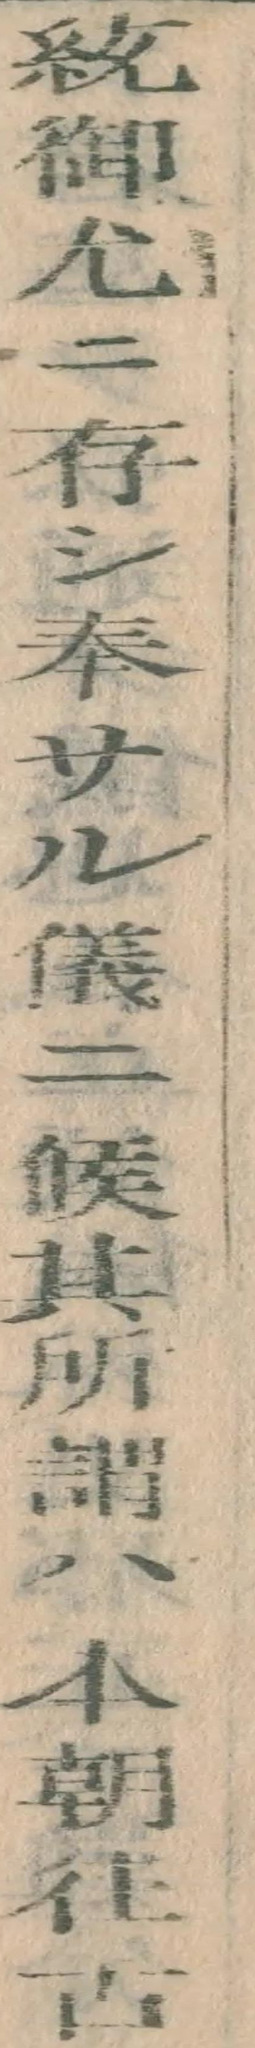統御尤ニ存シ奉サル儀ニ候其所謂ハ本朝往古
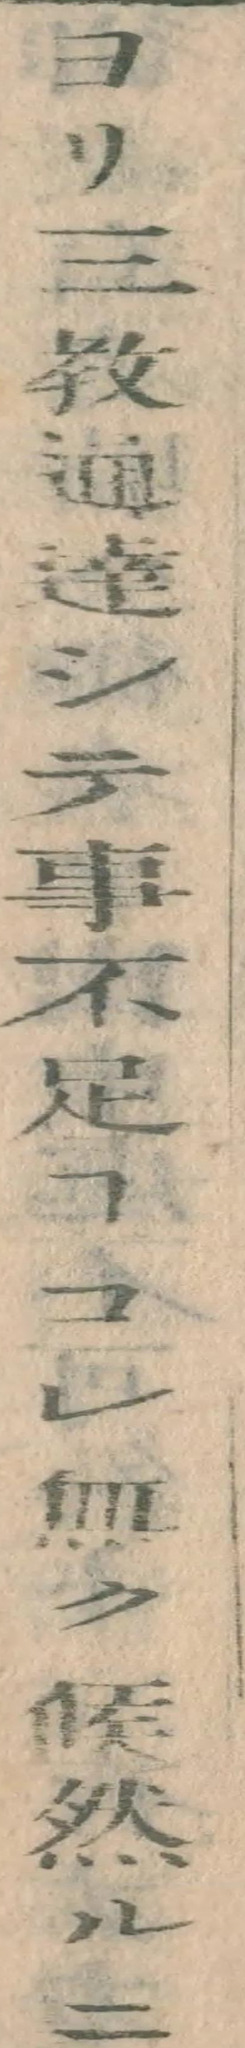ヨリ三教通達シテ事不足ヿコレ無ク候然ルニ
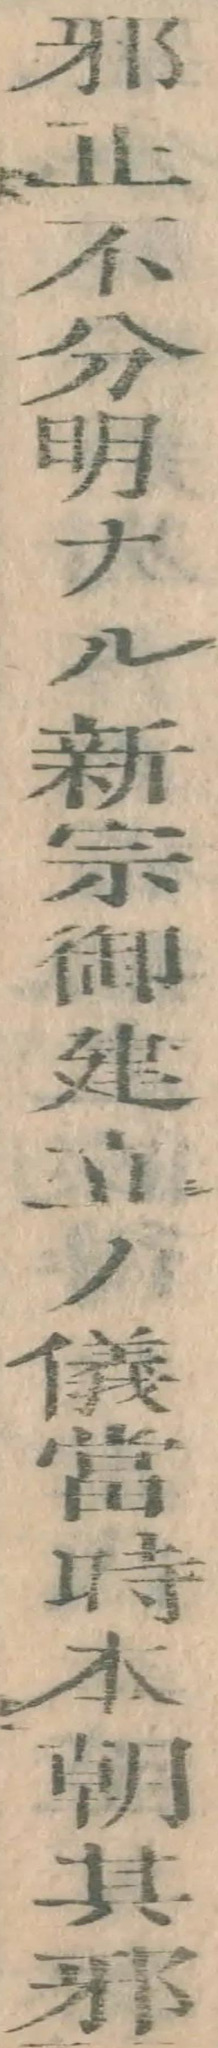邪正不分明ナル新宗御建立ノ儀当時本朝其邪

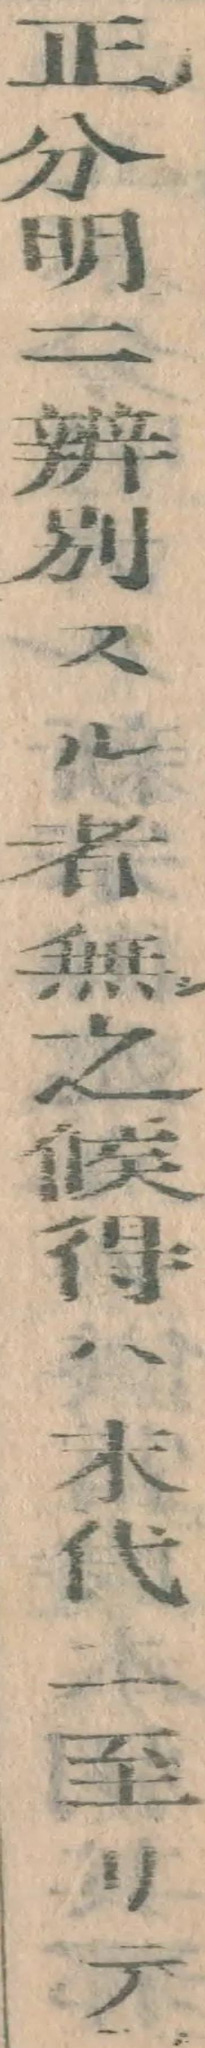正分明ニ弁別スル者無之候得ハ末代ニ至リテ
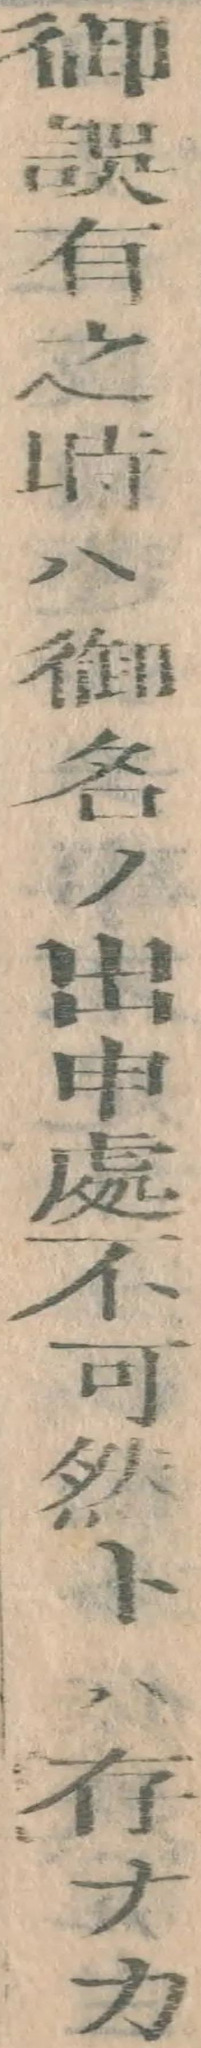御誤有之時ハ御名ノ出申処不可然トハ存ナカ
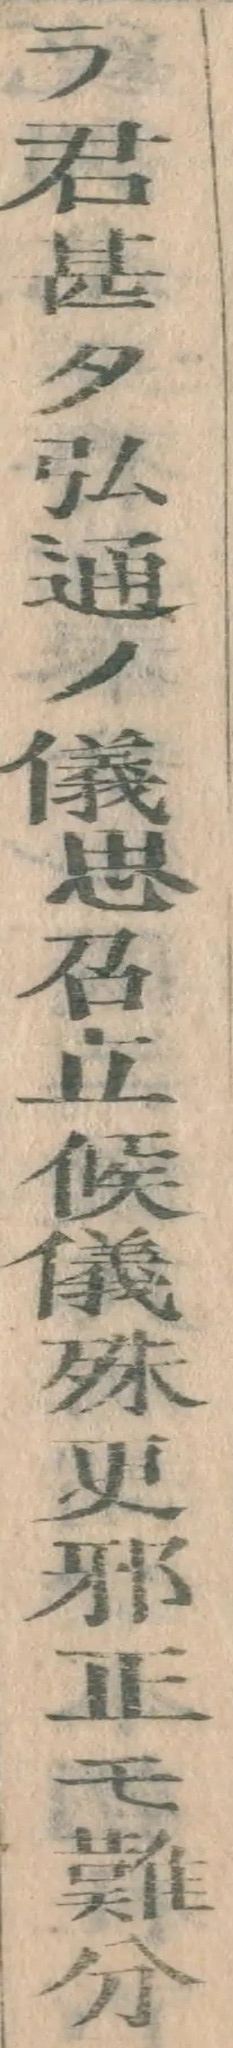ラ君甚タ弘通ノ儀思召立候儀殊更邪正モ難分
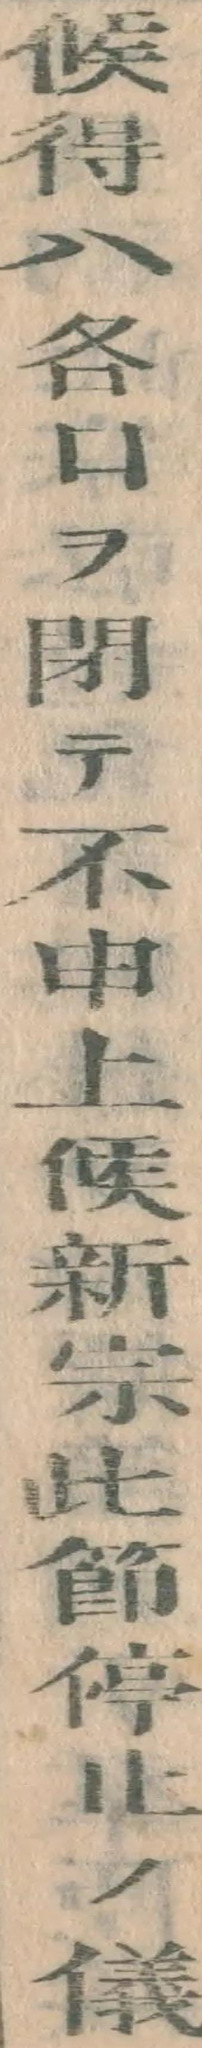候得ハ各口ヲ閉テ不申上候新宗此節停止ノ儀
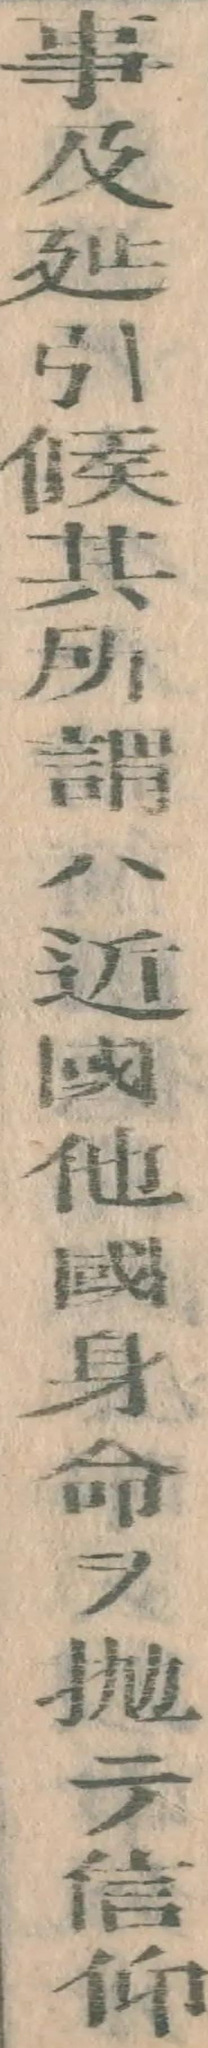事及延引候其所謂ハ近国他国身命ヲ抛テ信仰
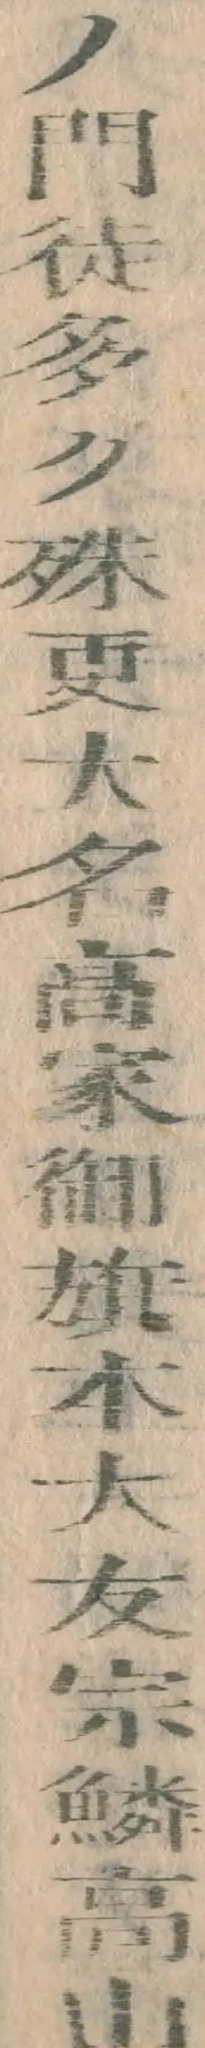ノ門徒多ク殊更大名高家御旗本大友宗鱗高山
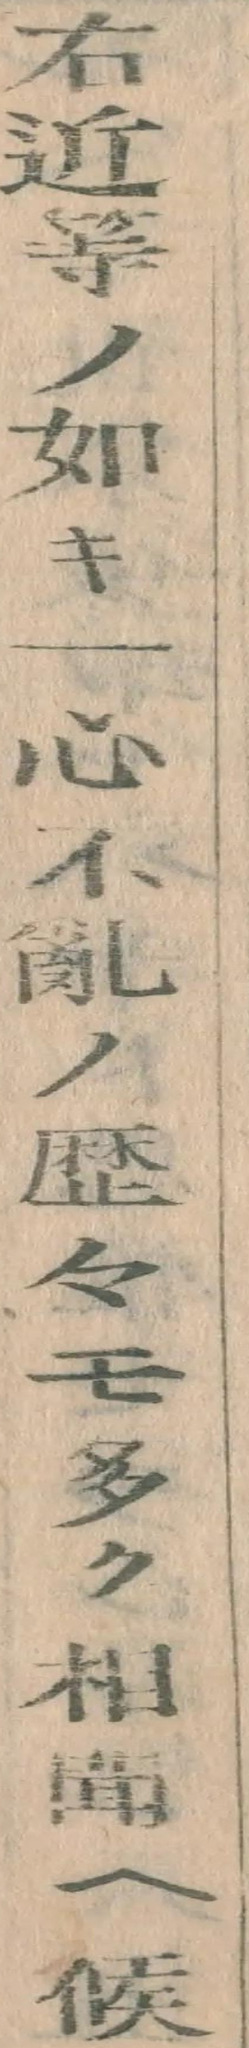右近等ノ如キ一心不乱ノ歴々モ多ク相聞ヘ候
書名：南蛮寺興廃記
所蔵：国立国会図書館 National Diet Library, JAPAN
